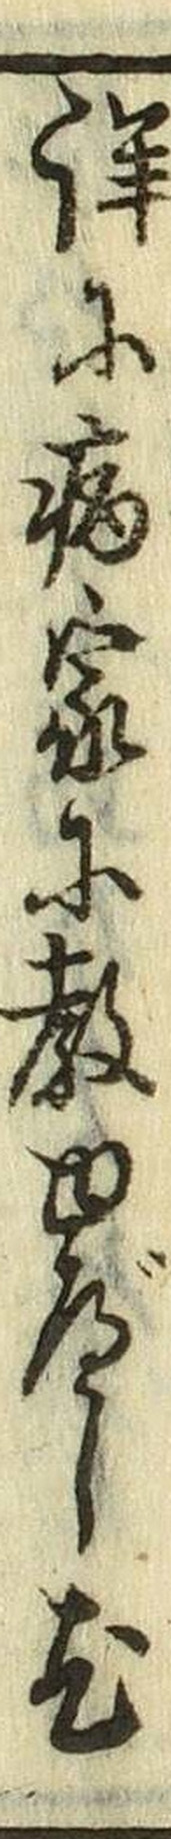詳に病家に教ゆべし尤
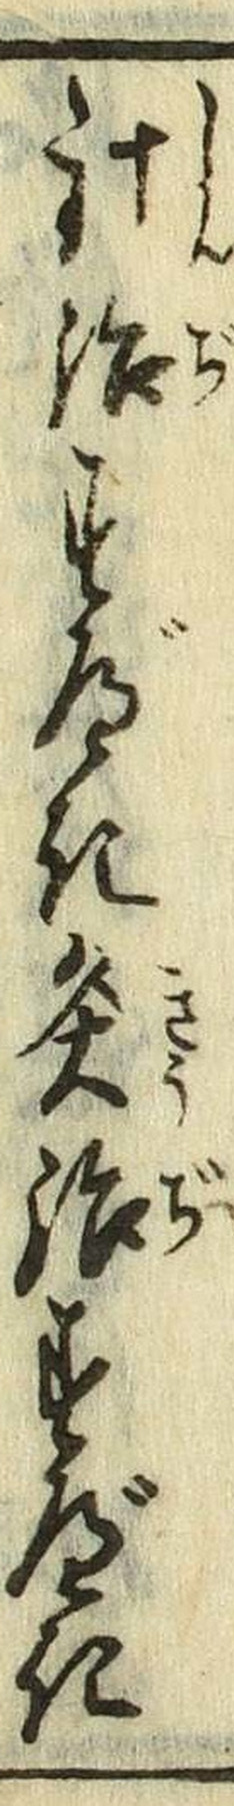針治すべき灸治すべき
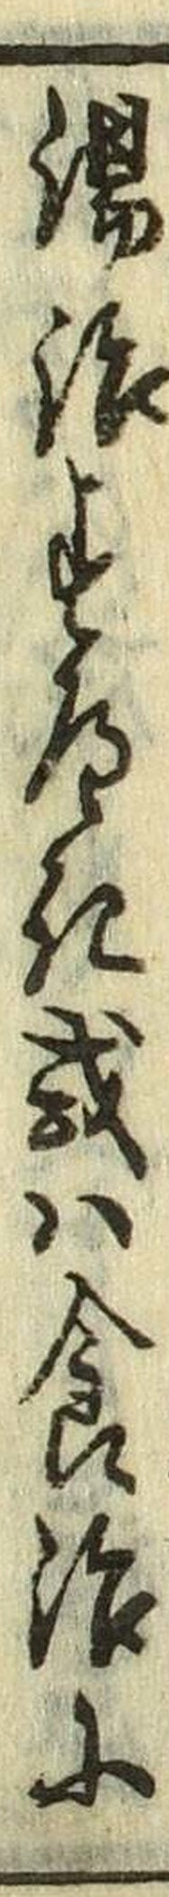湯治すへき或は食治に
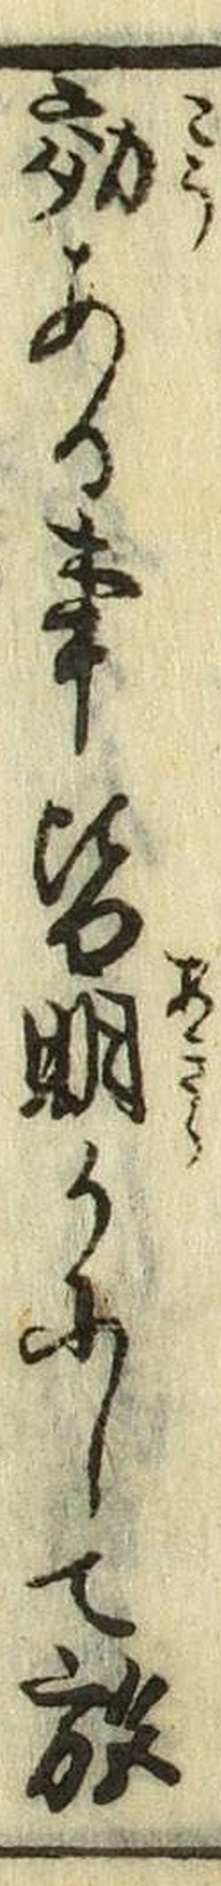効ある事皆明かにして施
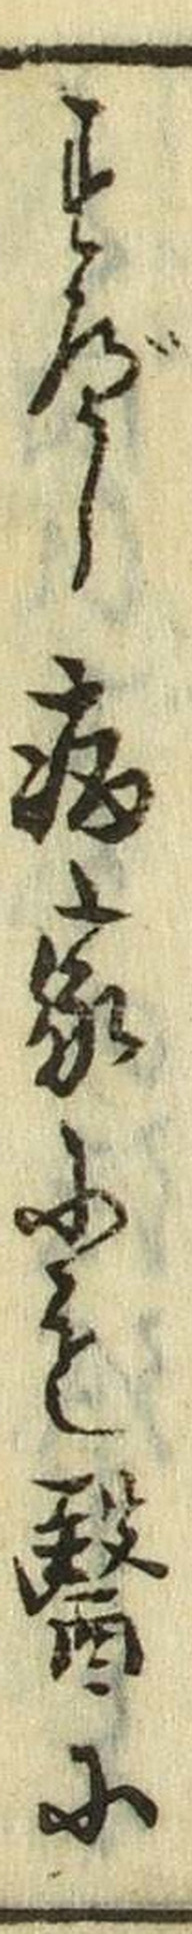すべし病家にも医に

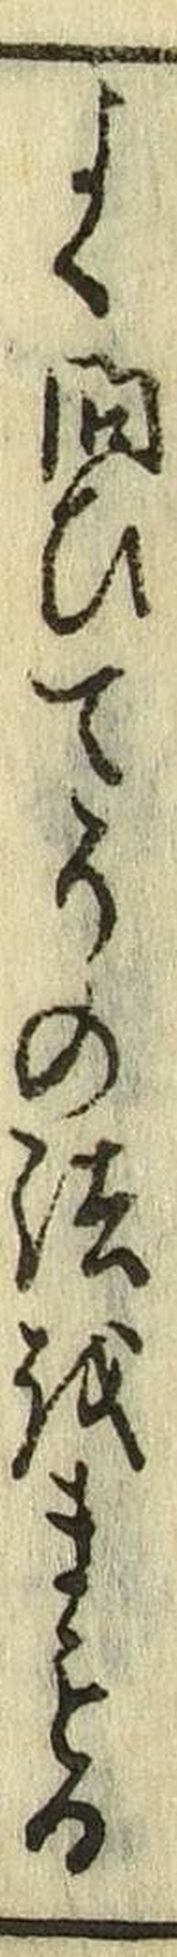よく問ひてその法をまもる
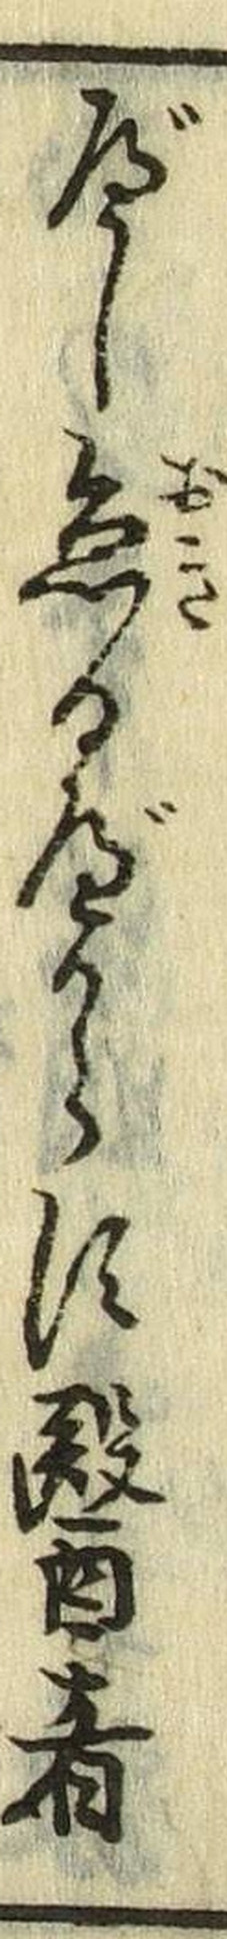べし怠るべからす医者
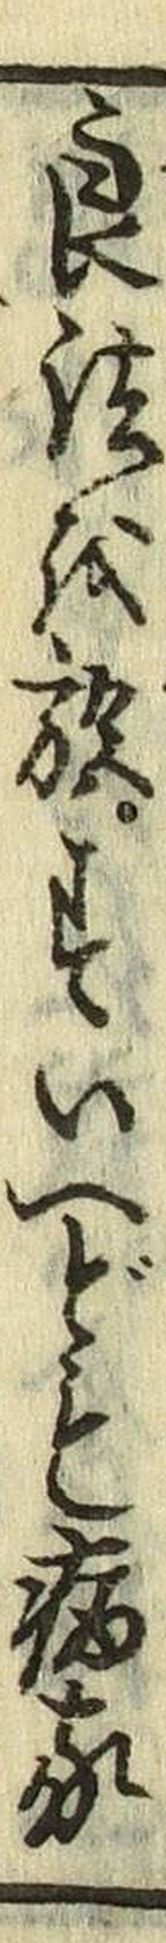良法を施。すいへども病家
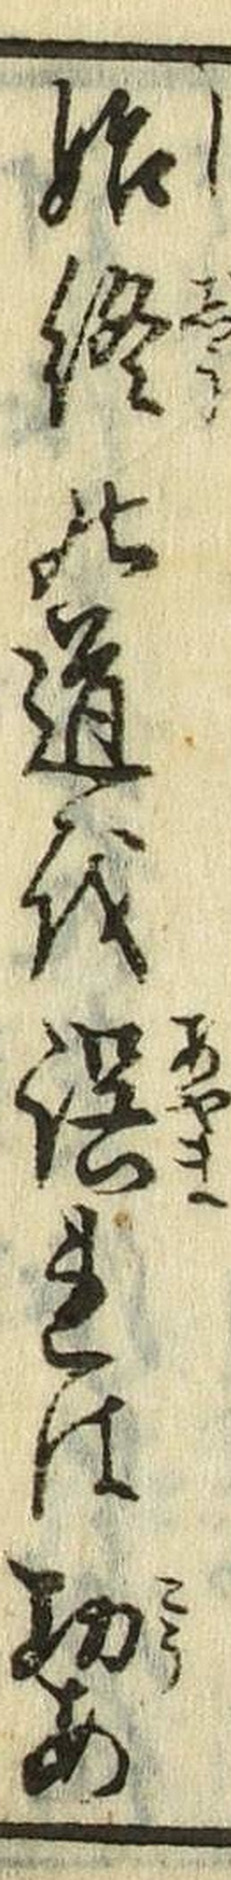始終此道を誤れは功あ
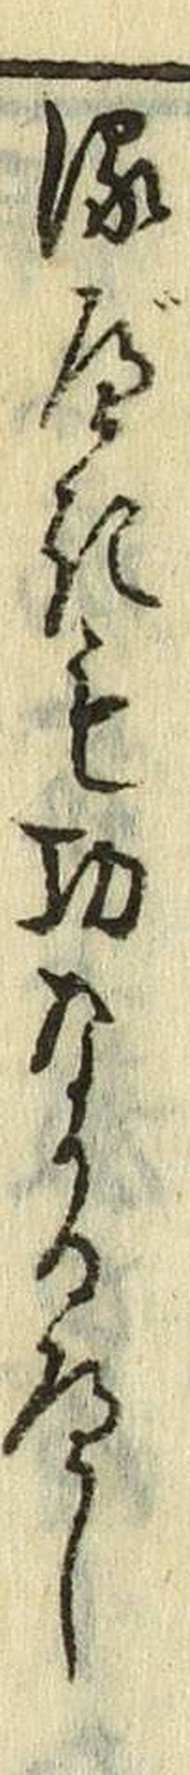るべきも功なかるへし
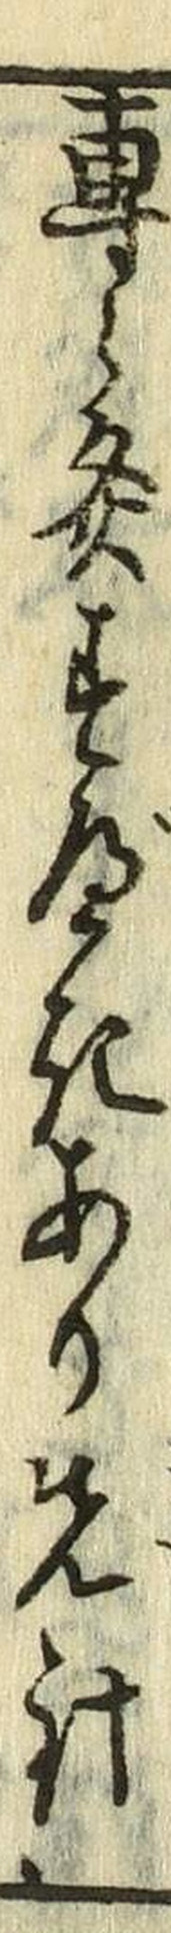専ら灸すべきあり先針
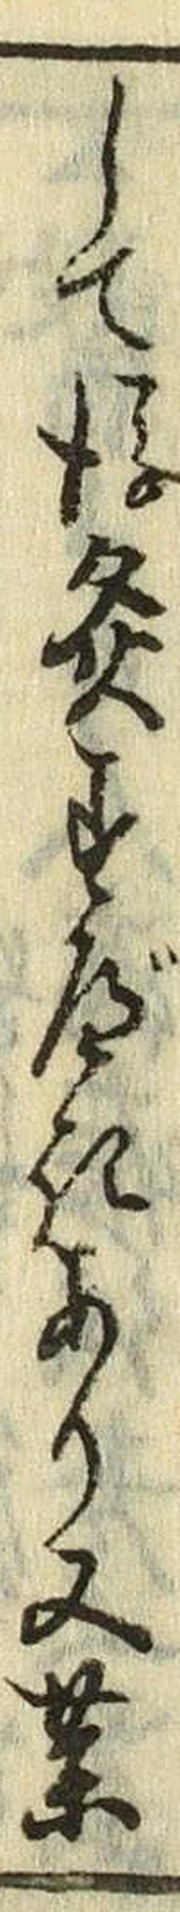して後灸すべきあり又薬
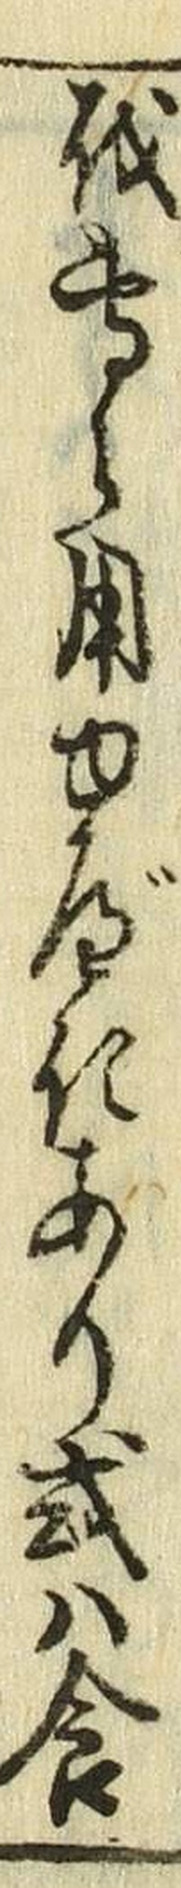を専ら用ゆべきあり或は食
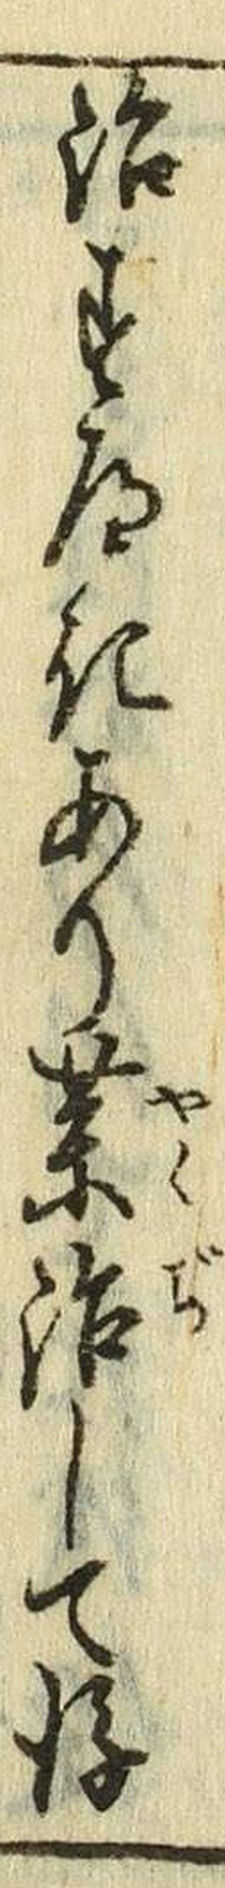治すへきあり薬治して後
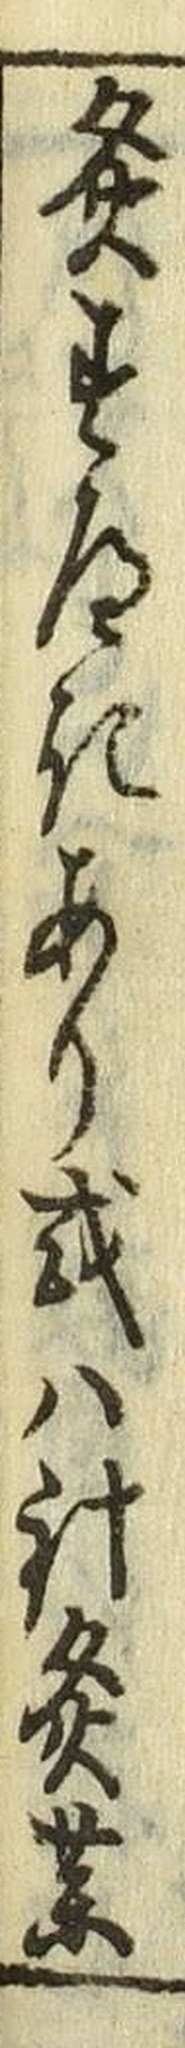灸すへきあり或は針灸薬
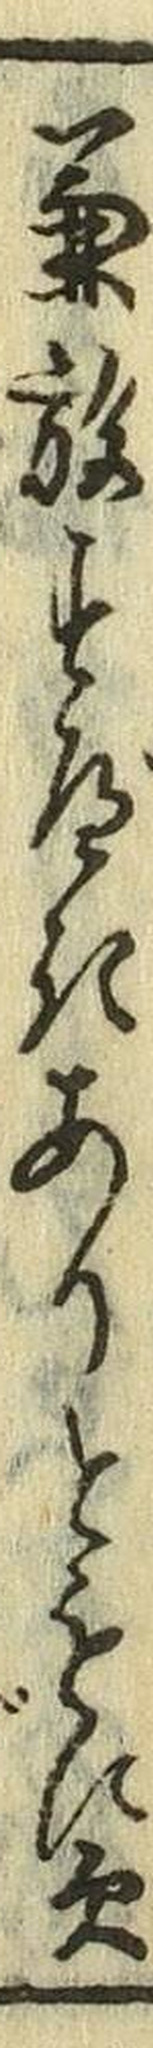兼施すべきありともに欠
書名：居家養生記
